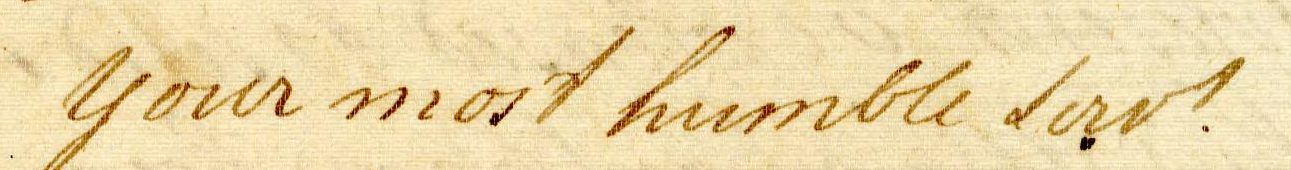Your most humble Serv^t.
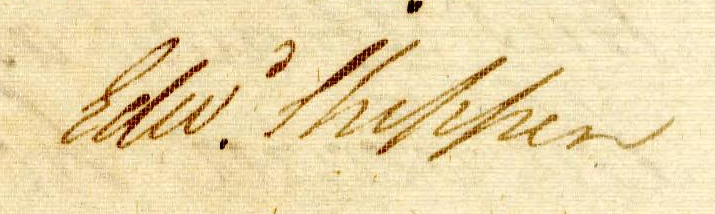Edw^d. Shippen
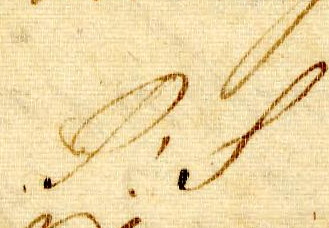P:S
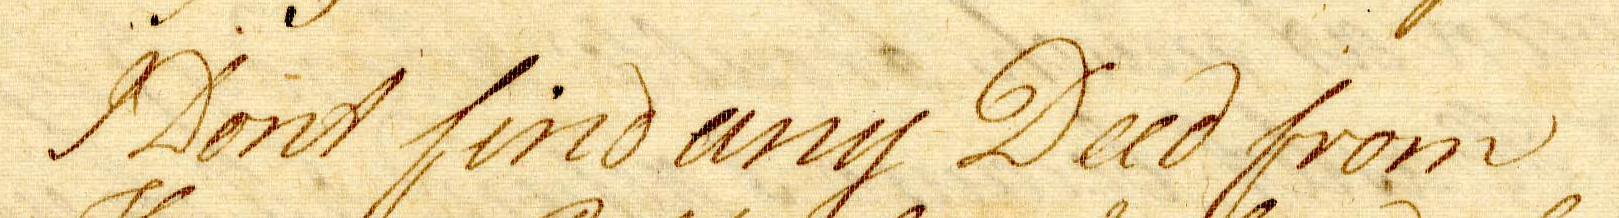I Dont find any Deed from
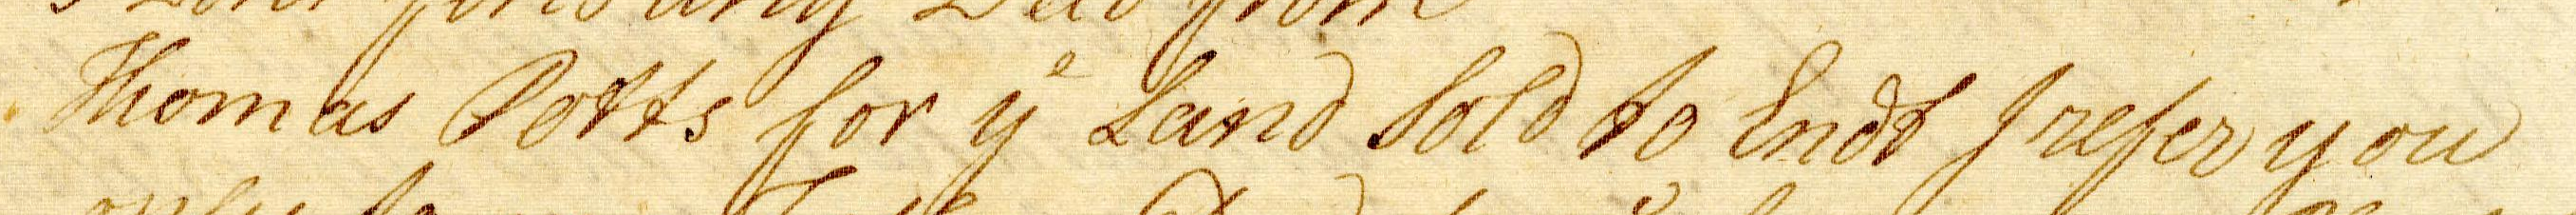Thomas Potts for y^e Land Sold to Endt I refer you
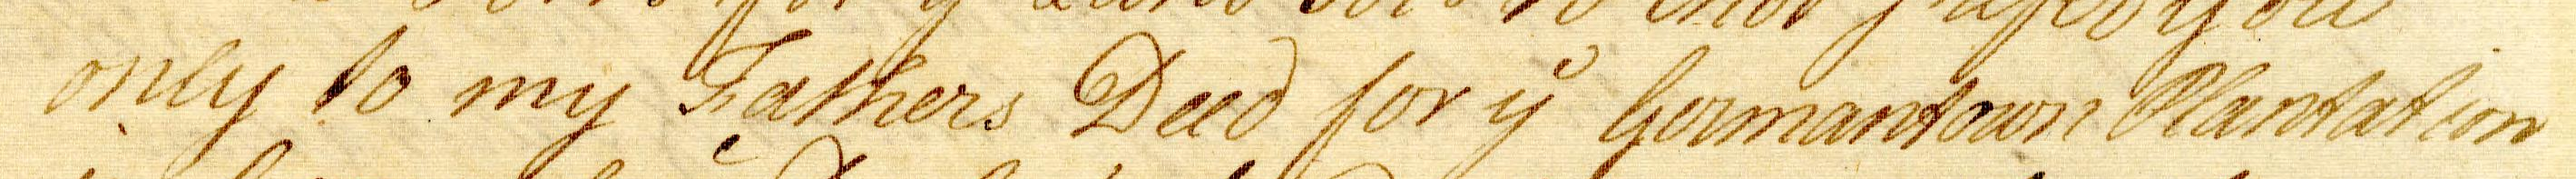only to my Fathers Deed for y^e Germantown Plantation
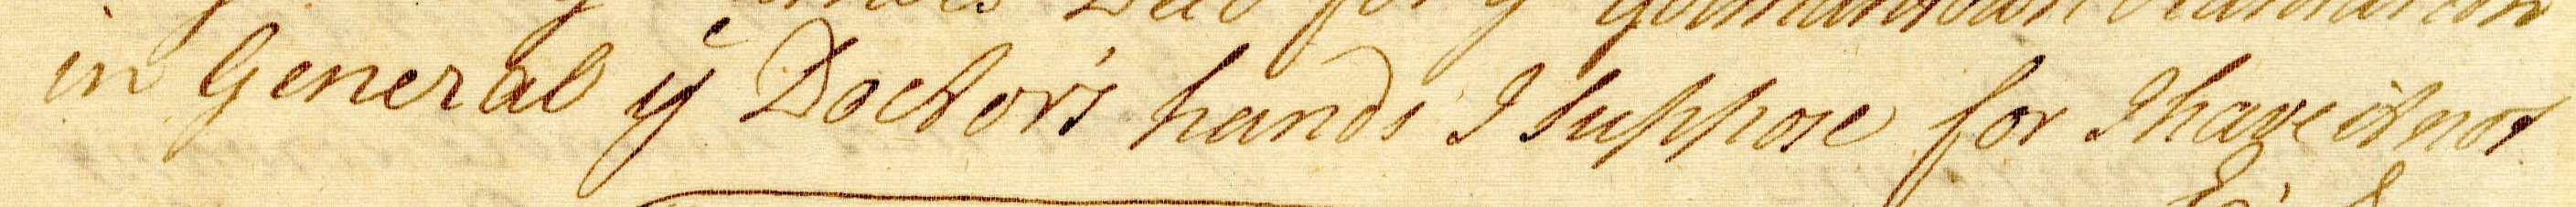in General y^e Doctor's hands I suppose for I have it not
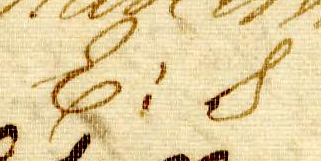E:S
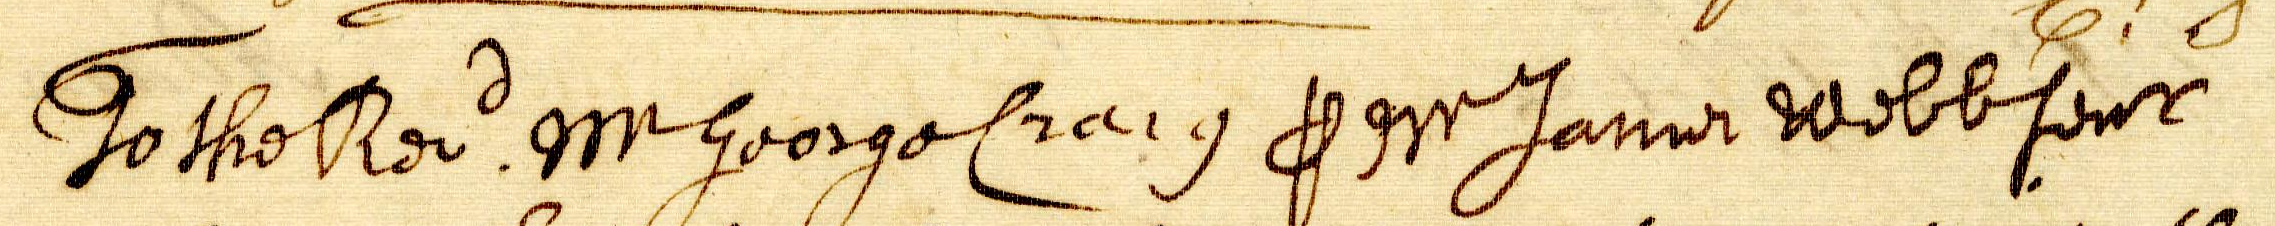To the Rev^d. M^r George Crary & M^r James Wellson
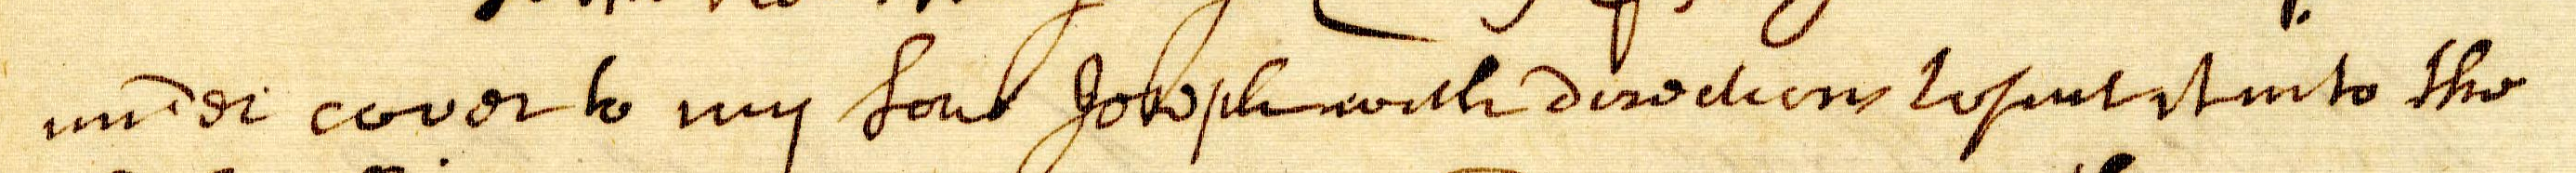under cover to my Son Joseph with directions to send it into the
